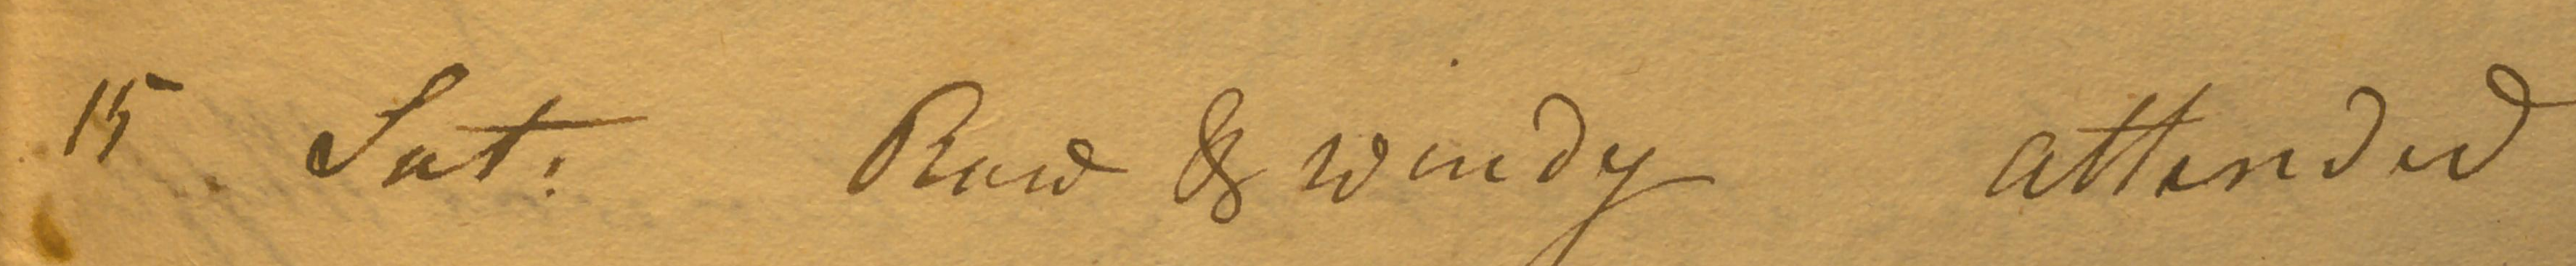15 Sat. Raw & windy attended
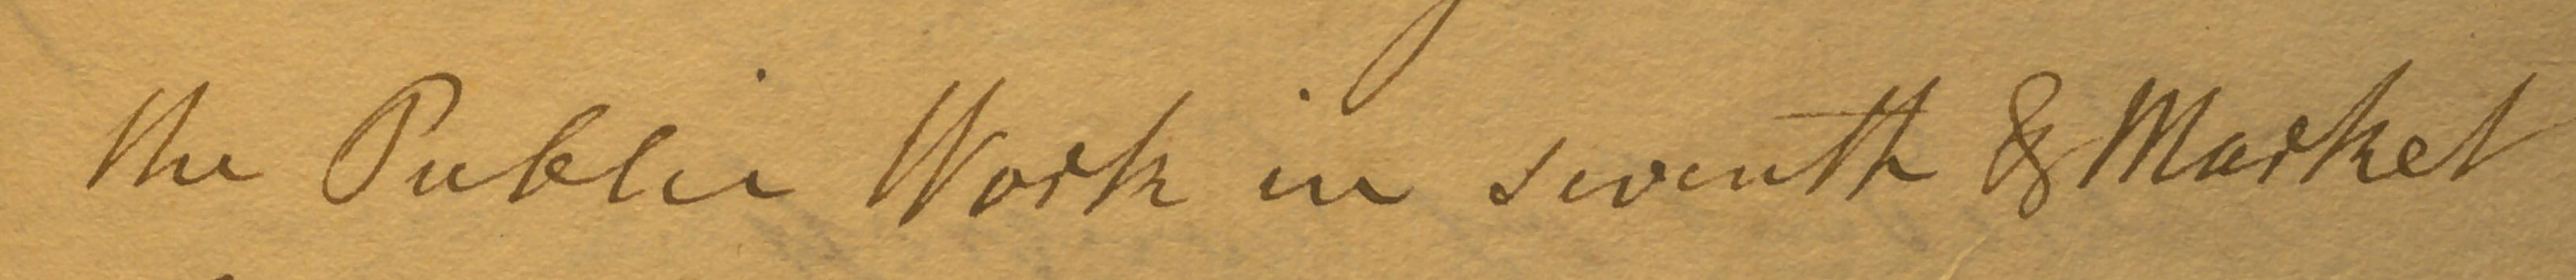the Public Work in seventh & Market
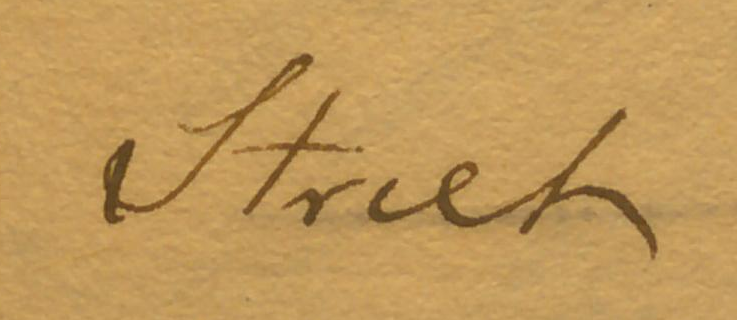Street
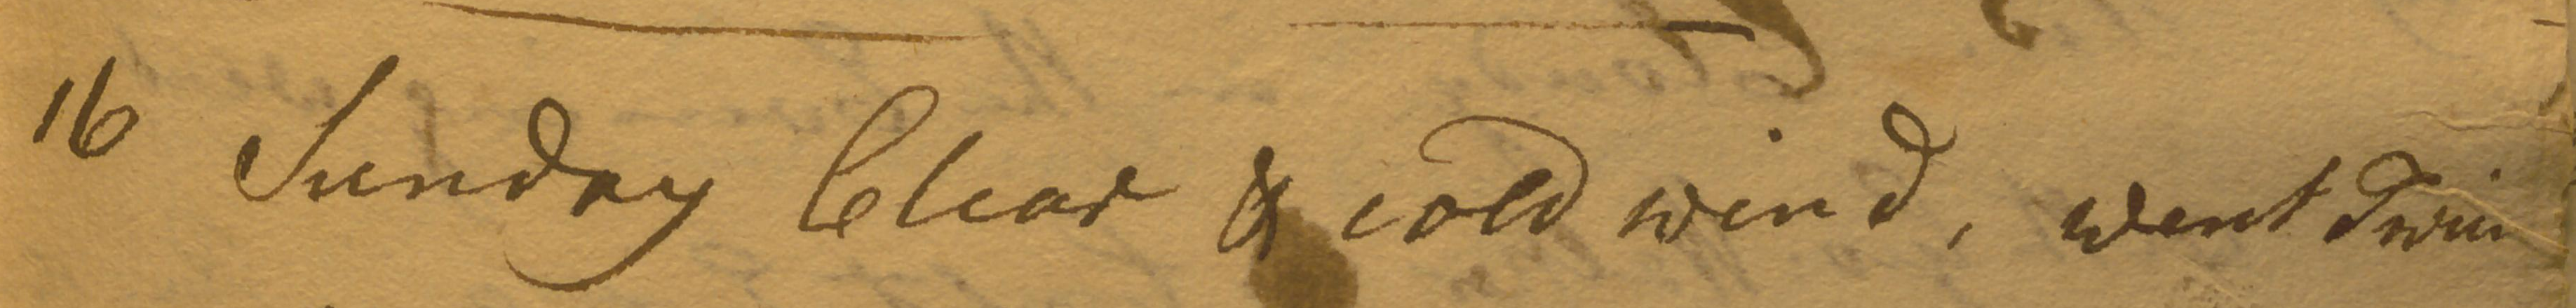16 Sunday Clear & cold wind, went Twice
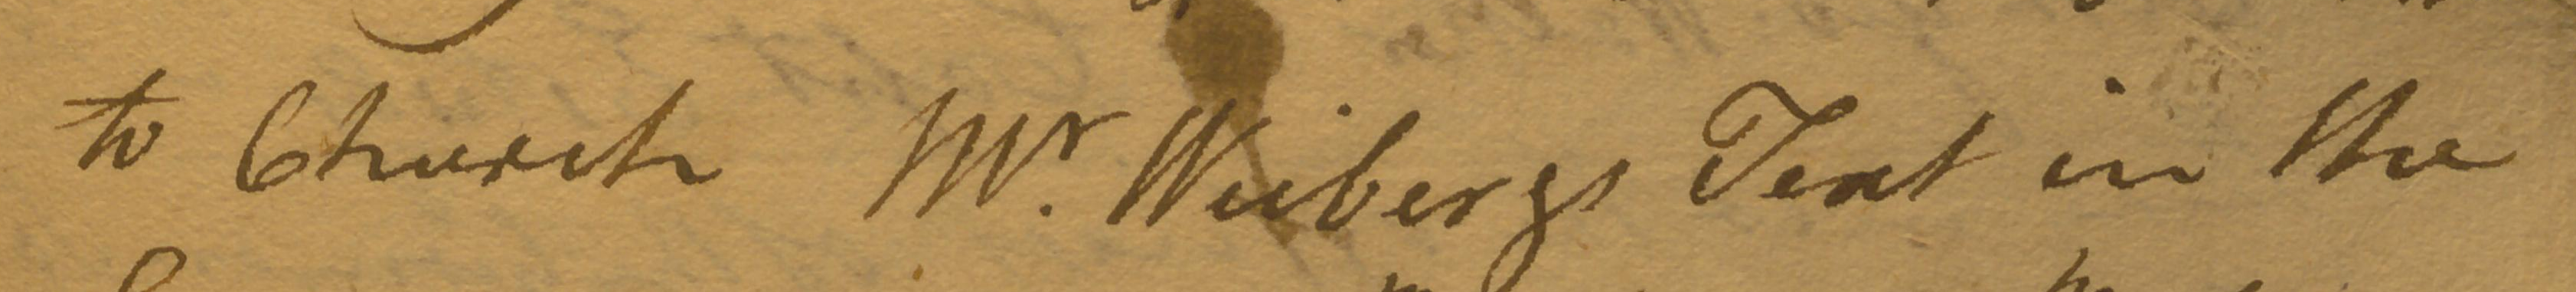to Church M^r. Weibergs Text in the
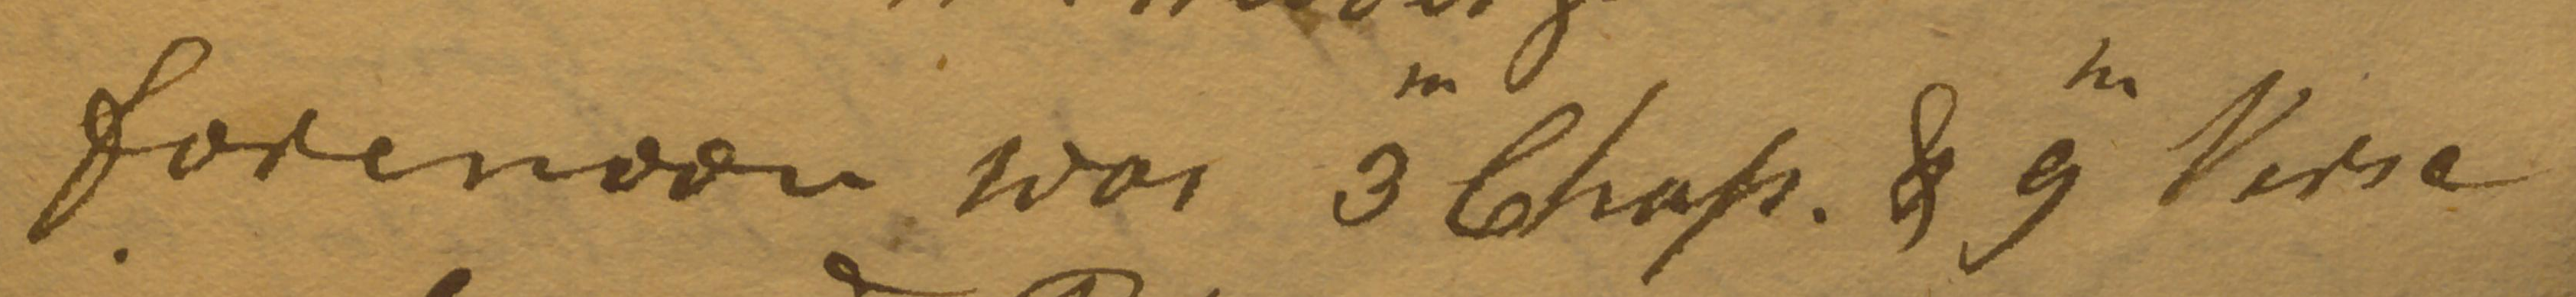forenoon was 3^th Chap. & 9^th Verse
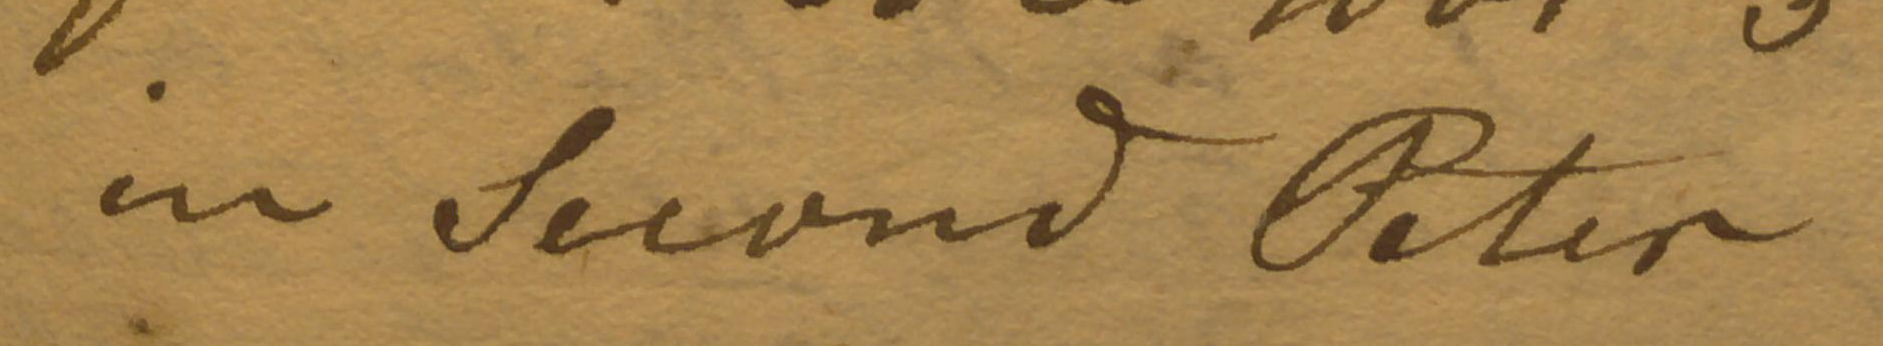in second Peter
